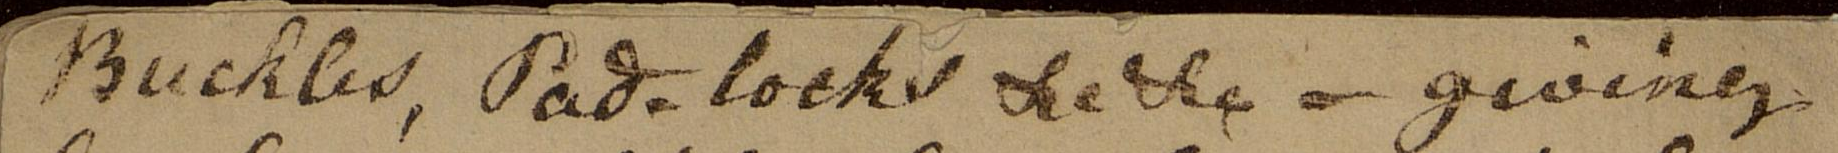Buckles, Pad-lock &c &c- giving
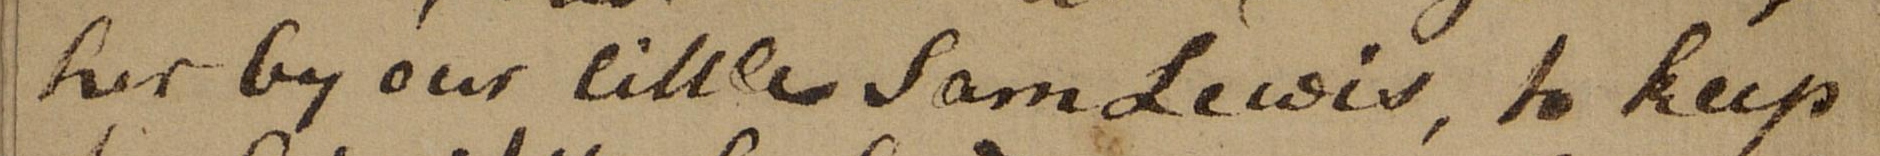her by our little Sam Lewis, to keep
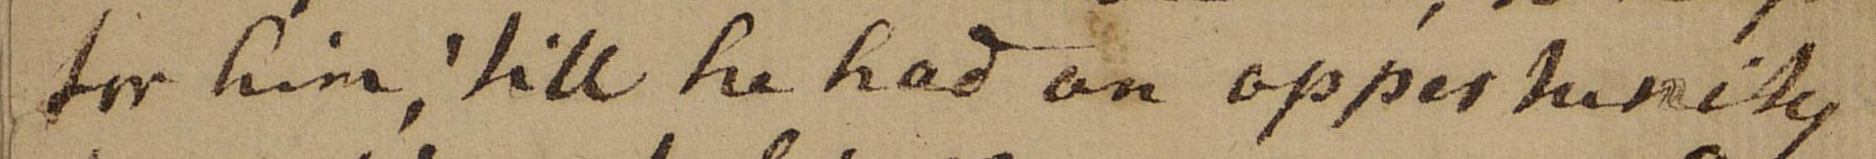for him, 'till he had an oppertunity
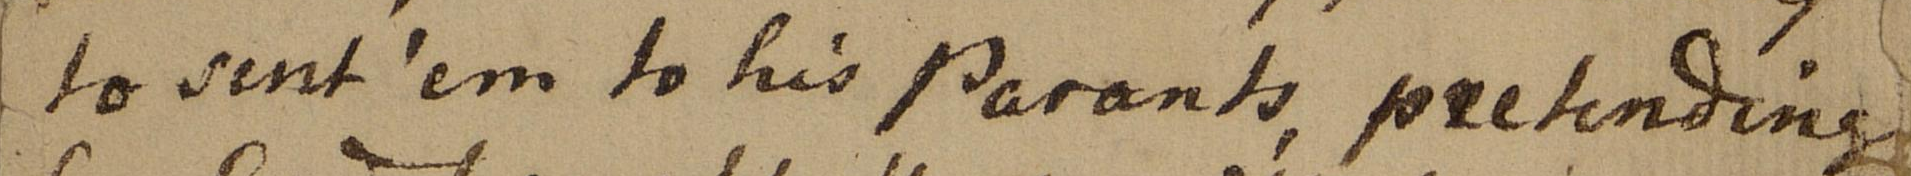to sent 'em to his Parants, pretending
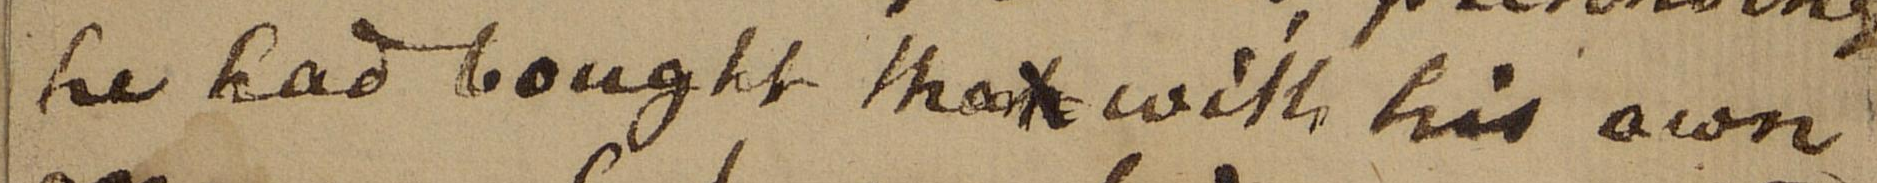he had bought that with his own
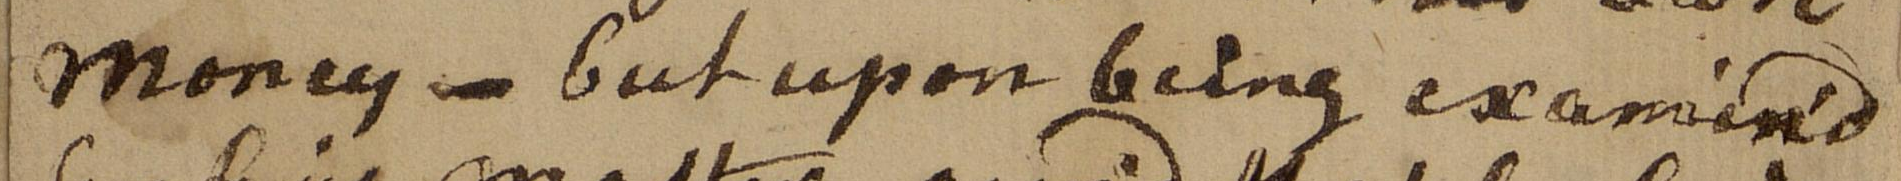money- but upon being examin'd
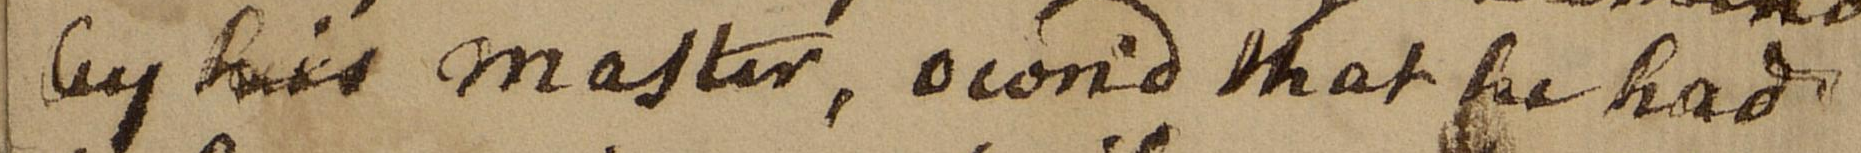by this master, own'd that he had
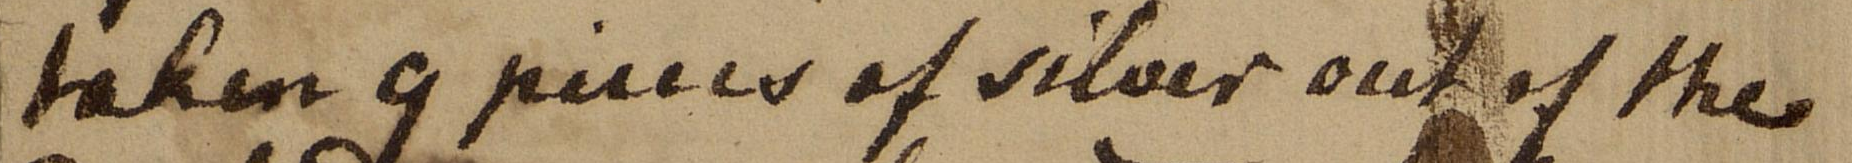taken 9 pieces of silver out of the
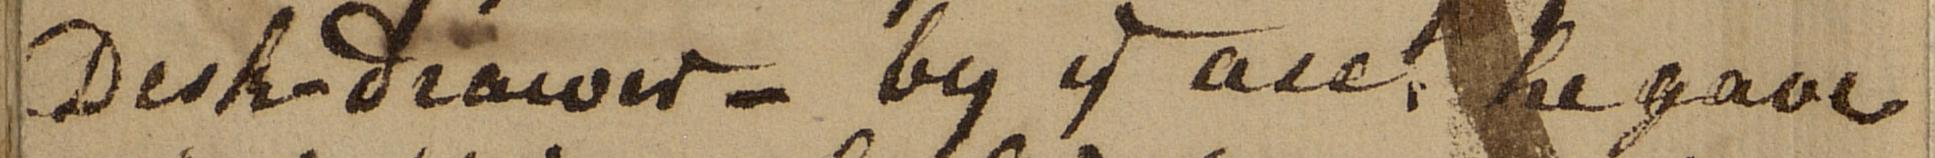Desk-drawer- by y^e acc^t. he gave
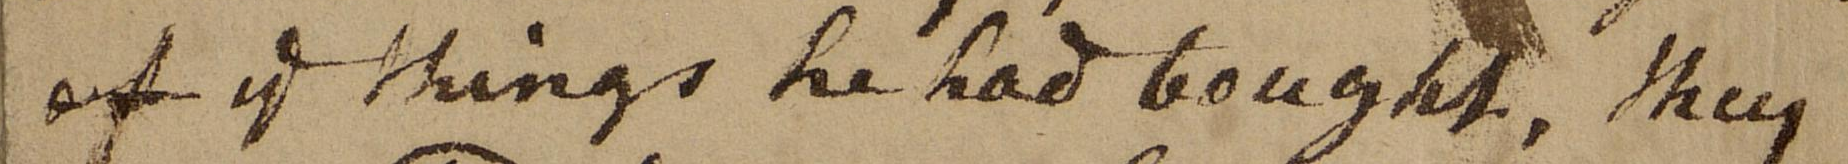of y^e things he had bought, they
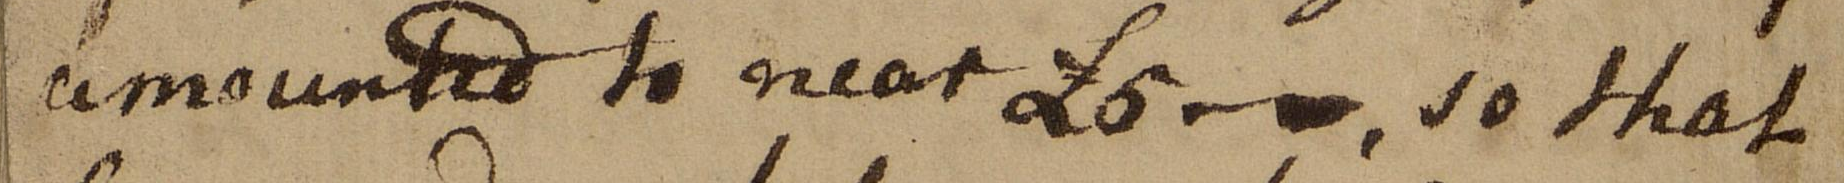amounted to near £5--, so that
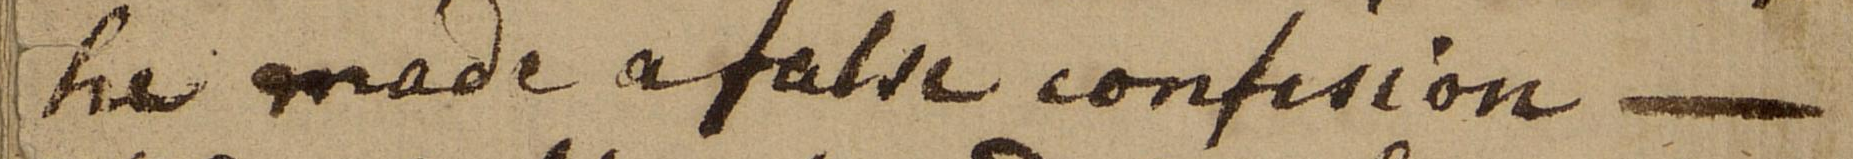he made a false confesion-
